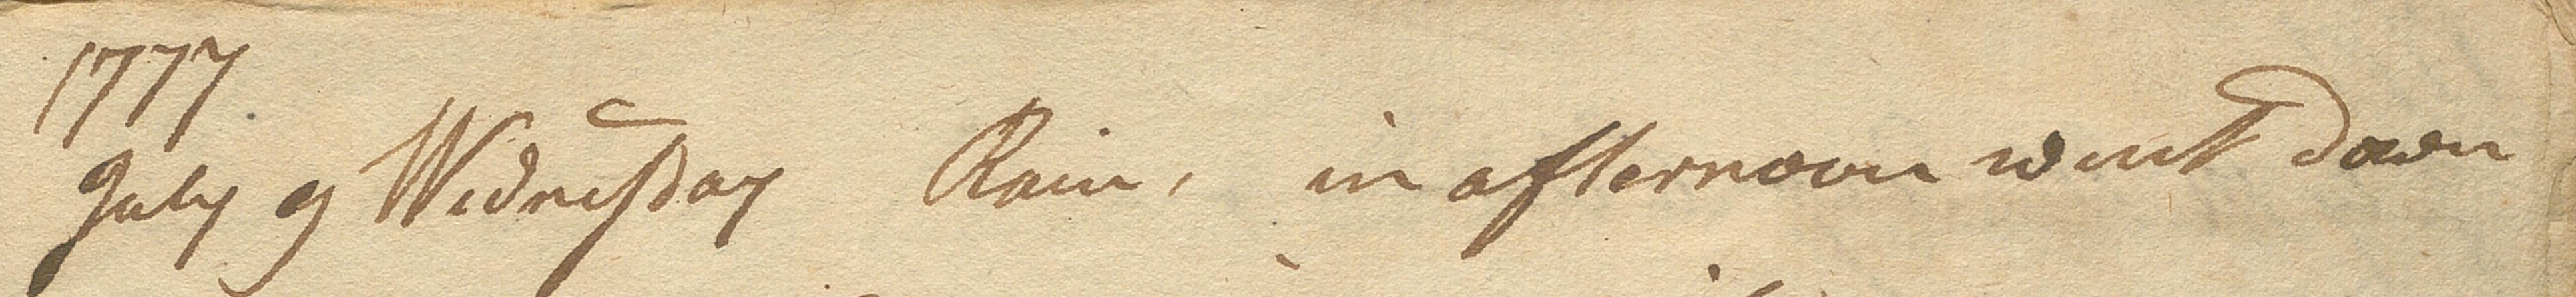July 9 Wednesday Rain, in afternoon went down
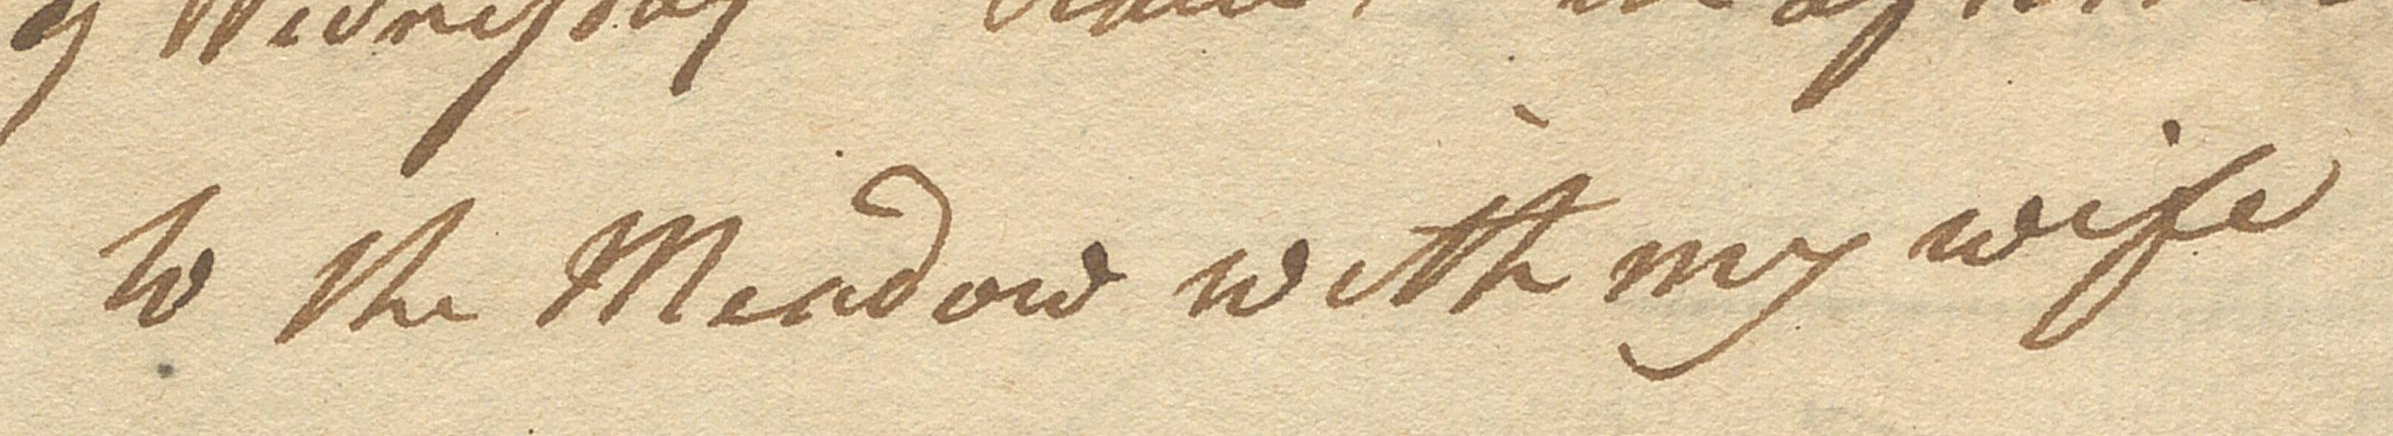to the Meadow with my wife
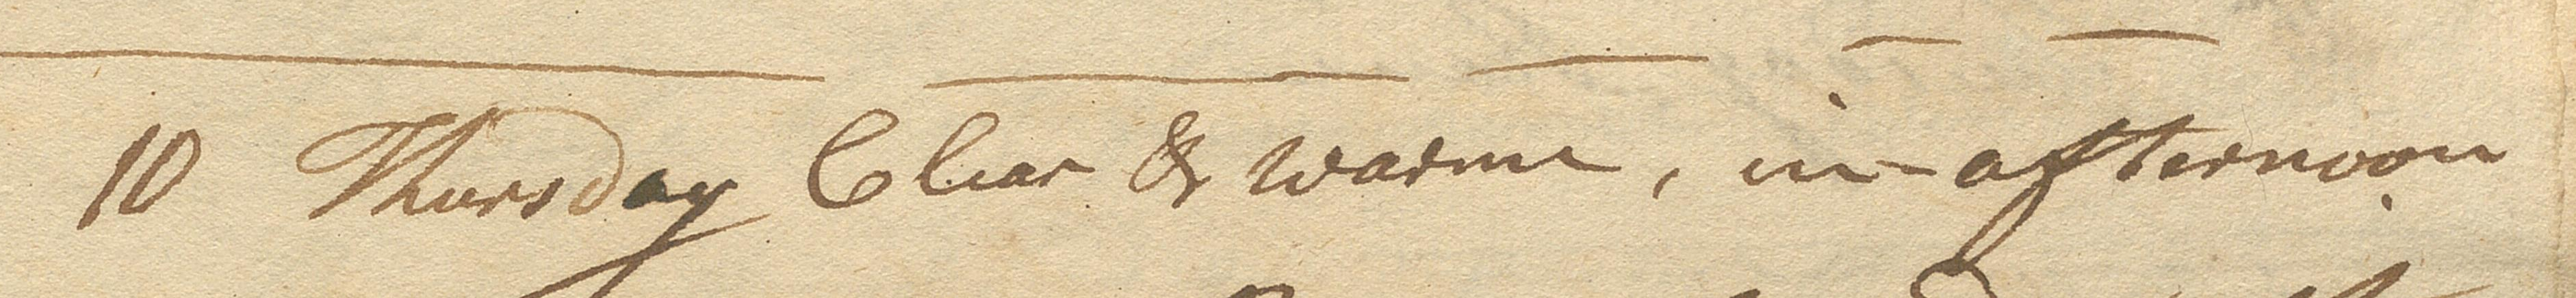10 Thursday Clear & warme, in afternoon
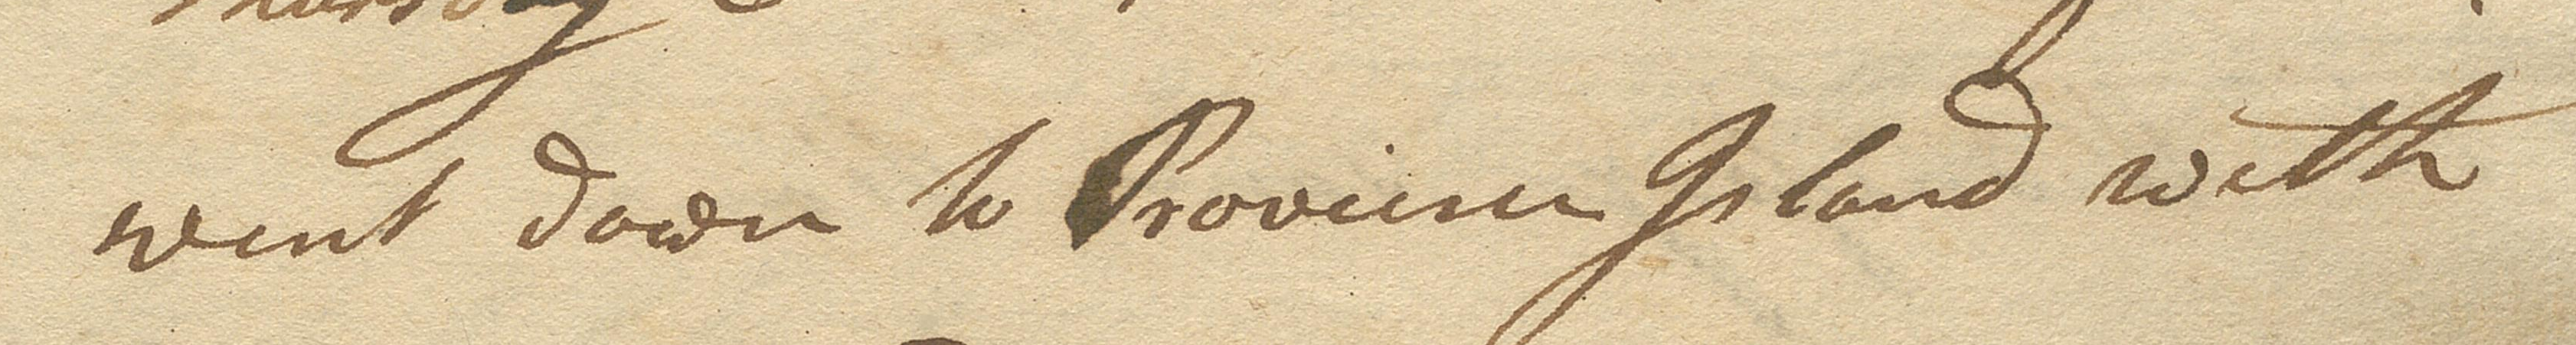went down to Provinnce Island with
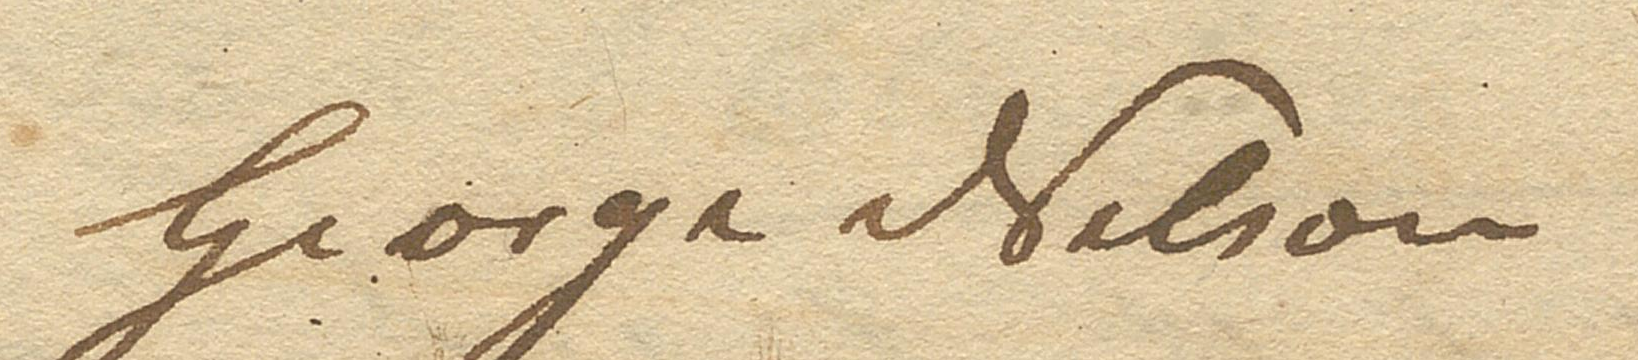George Nelson
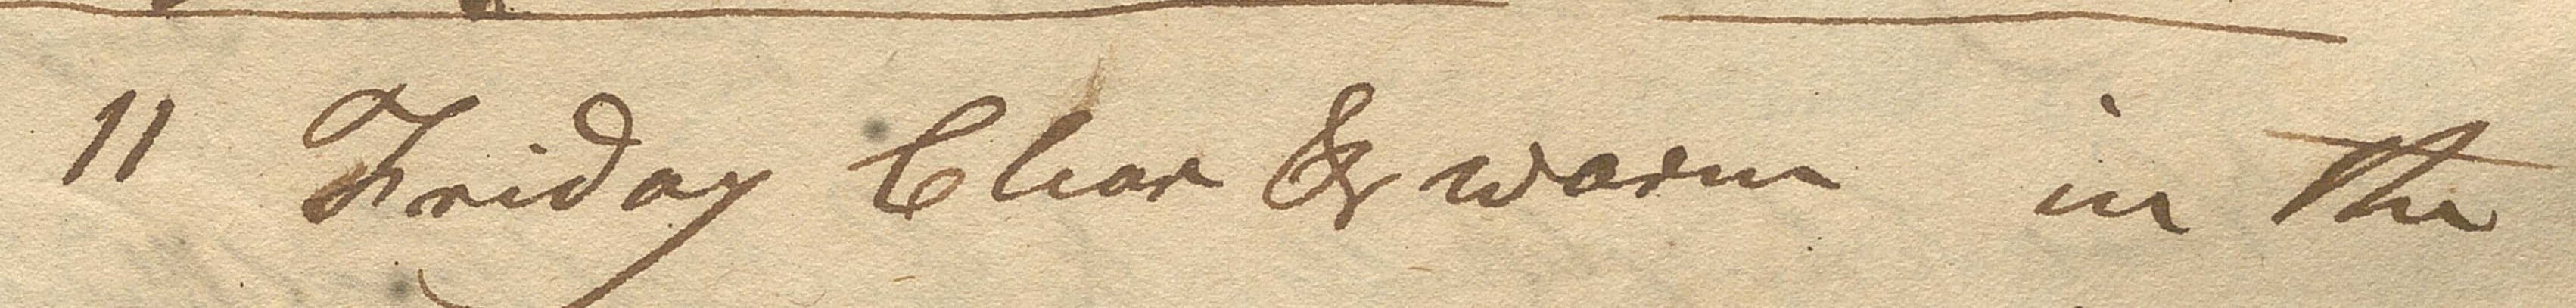11 Friday Clear & warm in the
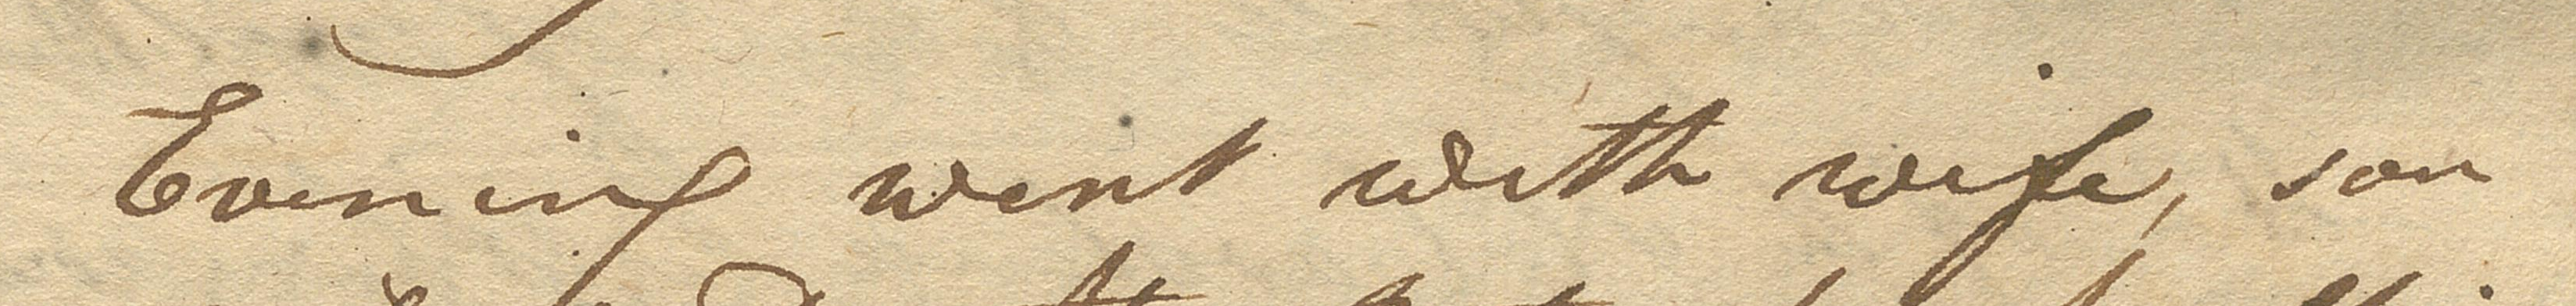Evening went with wife, son
